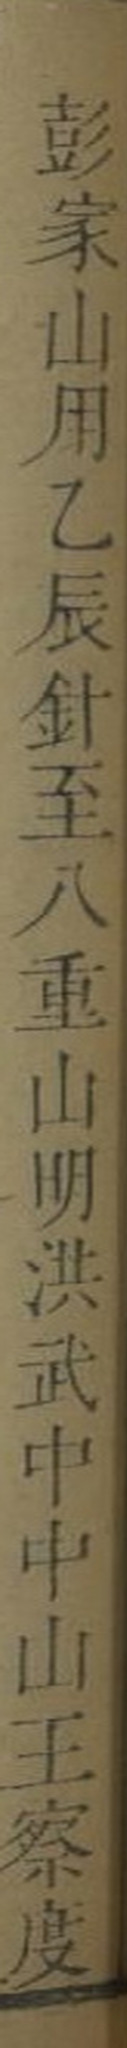彭家山用乙辰針至八重山明洪武中中山王察度
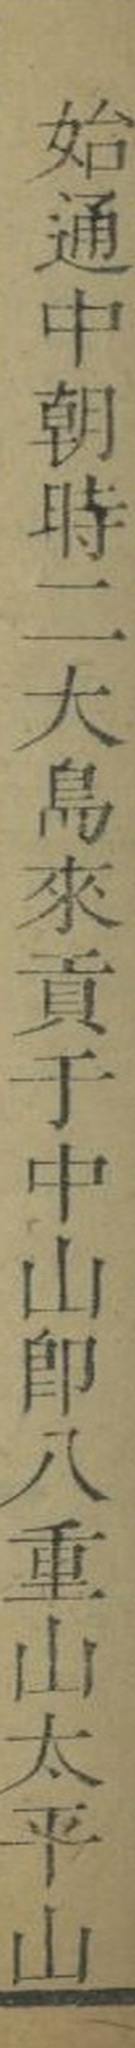始通中朝時二大島来貢于中山即八重山太平山
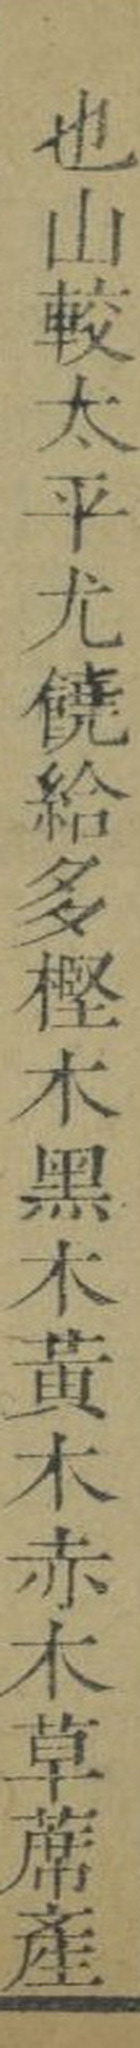也山較太平尤饒給多樫木黒木黄木赤木草蓆産
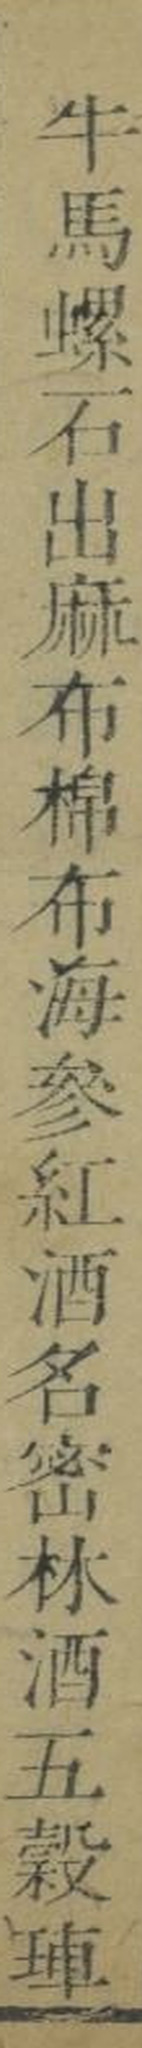牛馬螺石出麻布棉布海参紅酒名密林酒五穀
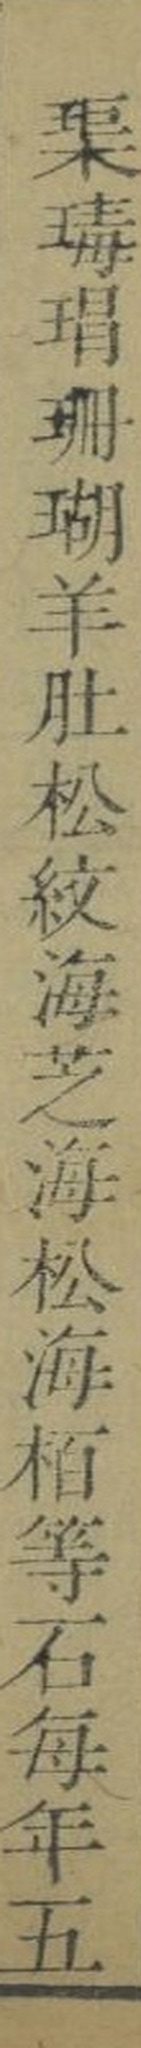璖瑇琩珊瑚羊肚松紋海芝海松海柏等石毎年五
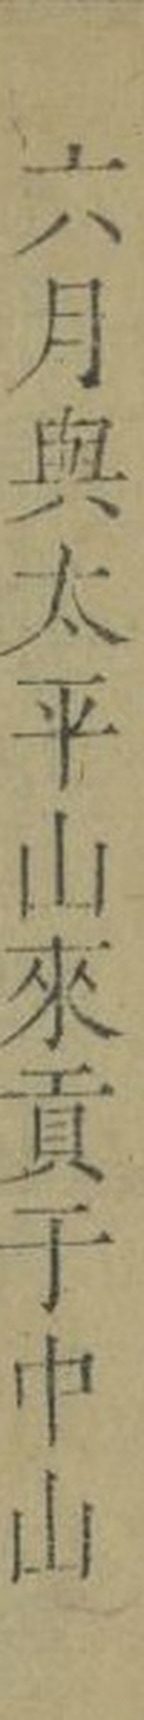六月与太平山来貢于中山
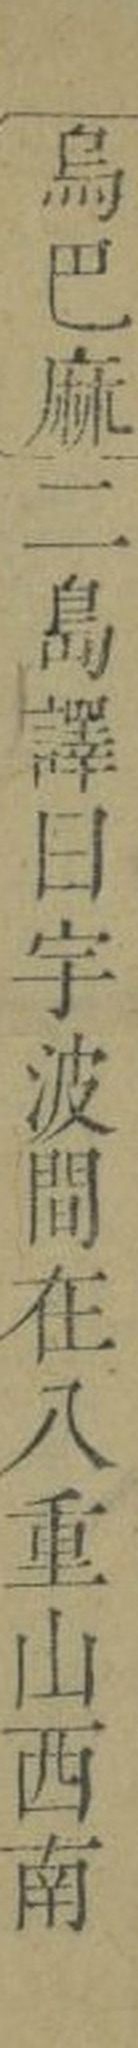[烏巴麻]二島訳曰宇波間在八重山西南
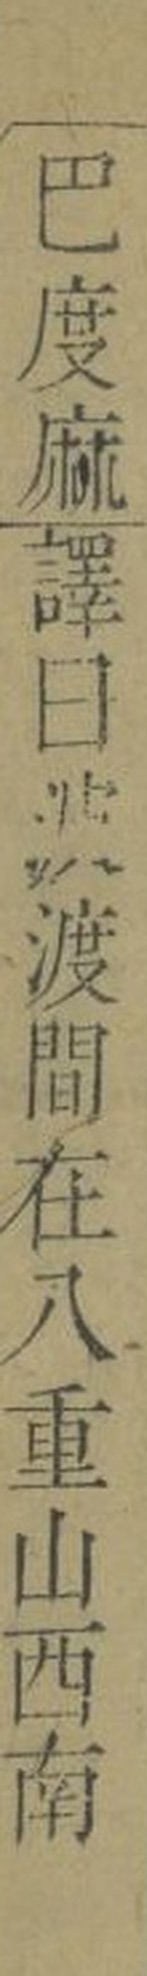[巴度麻]訳曰波渡間在八重山西南

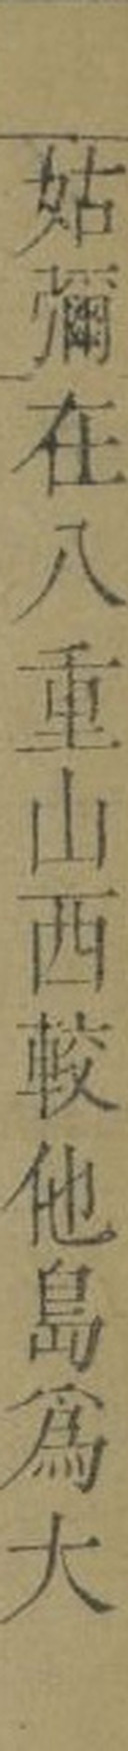[姑弥]在八重山西較他島為大
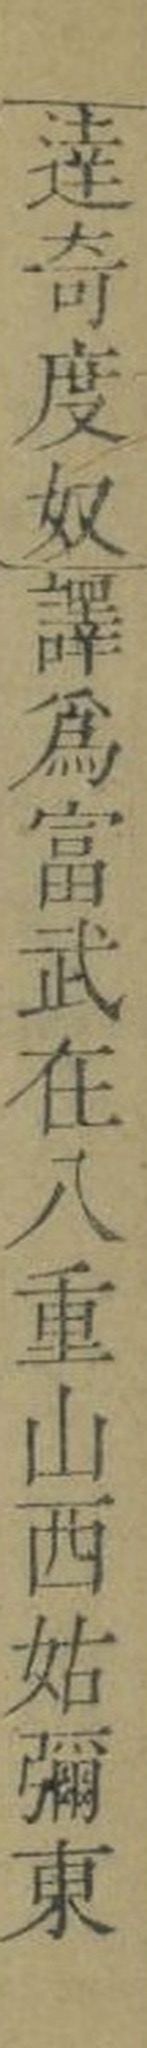[達奇度奴]訳為富武在八重山西姑弥東
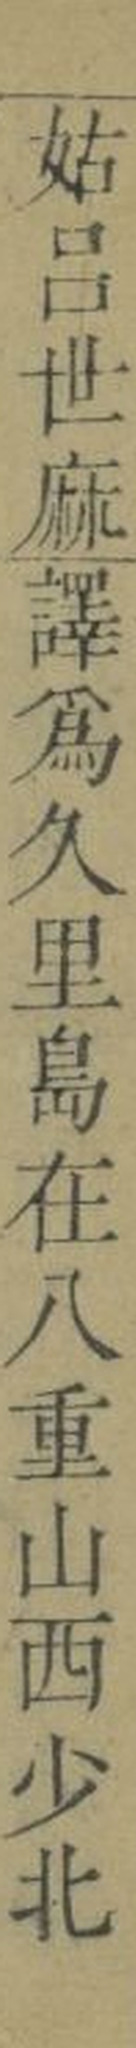[姑呂世麻]訳為久里島在八重山西少北
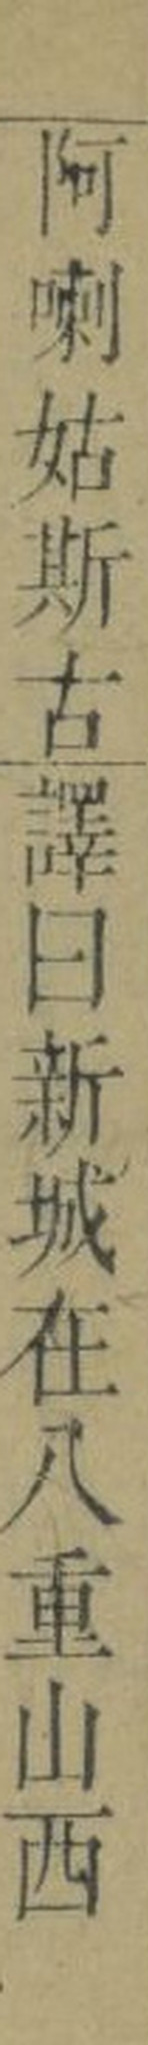[阿喇姑斯古]訳曰新城在八重山西
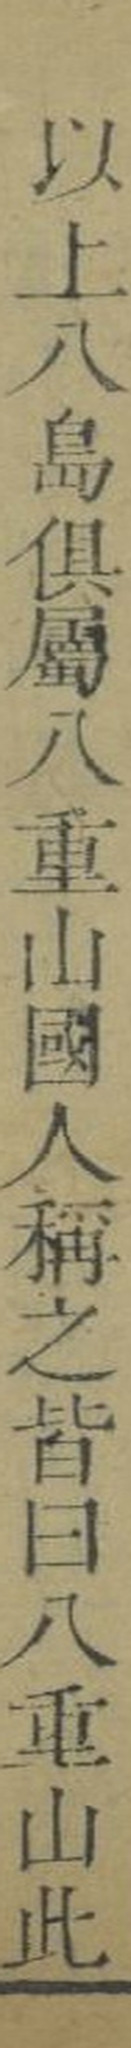以上八島俱属八重山国人称之皆曰八重山此
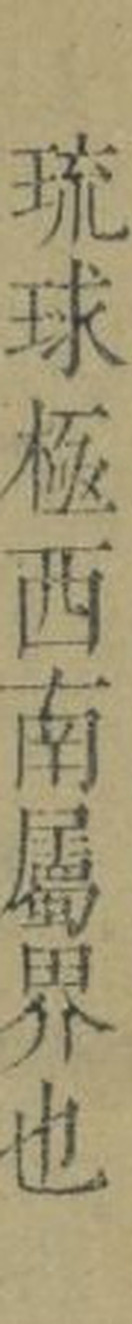琉球極西南属界也
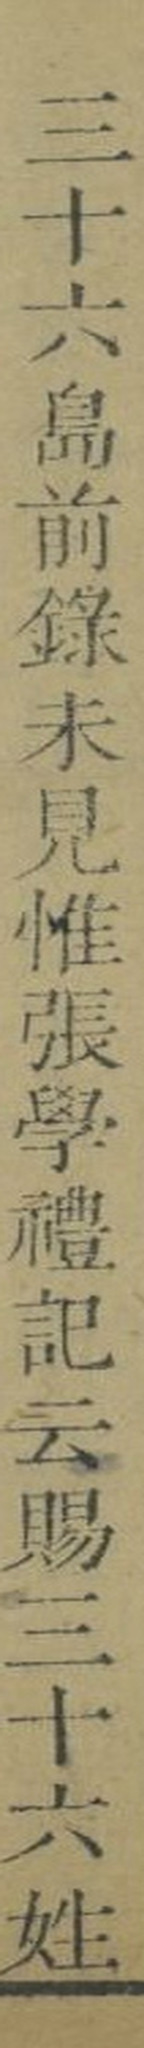三十六島前録未見惟張学礼記云賜三十六姓
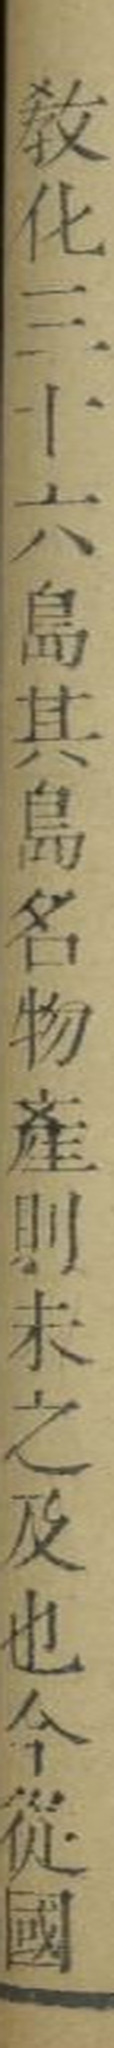教化三十六島其島名物産則未之及也今従国
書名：中山伝信録 巻四
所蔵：University of the Ryukyus Library
